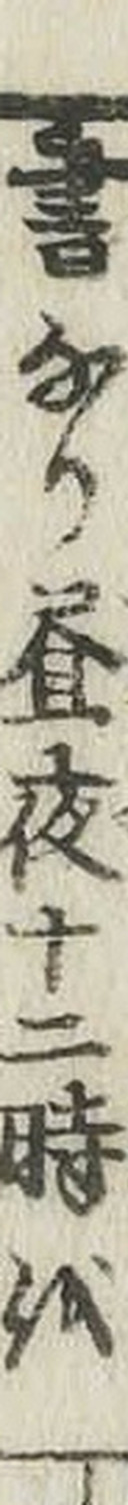書なり昼夜十二時を
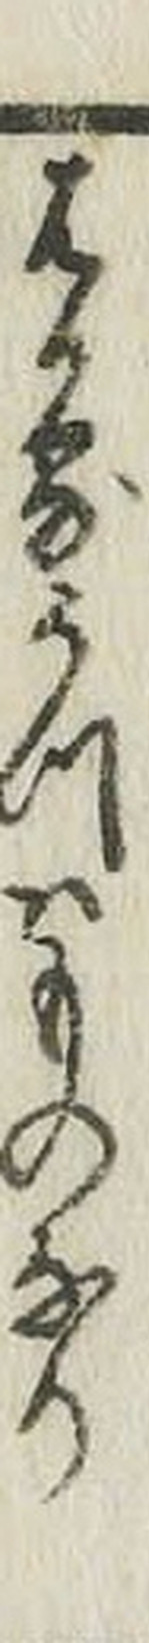はかるうつはものなり
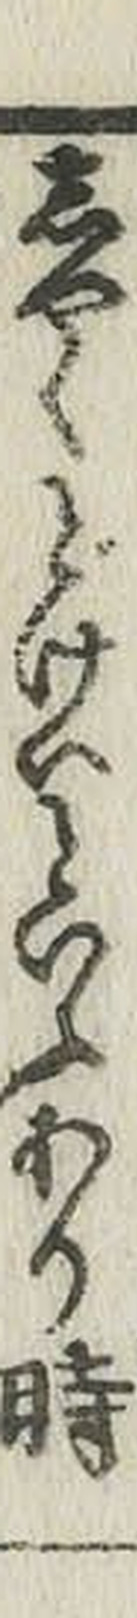しやくどけいといふあり時
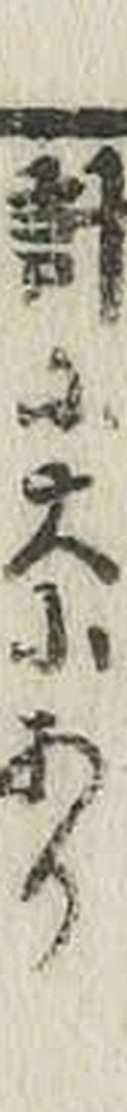計に大小あり
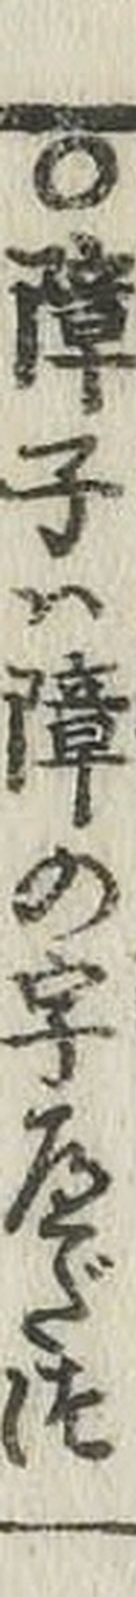○障子は障の字へだつ
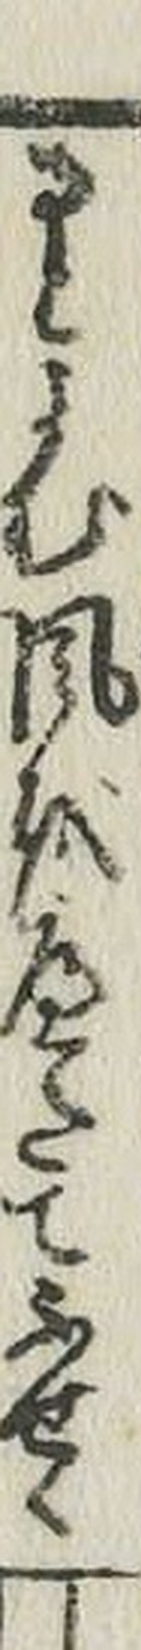るとよむ風をへたてふせく
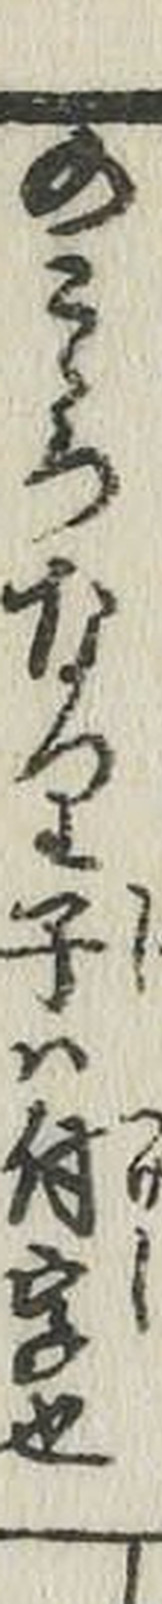のこゝろなり子は付字也
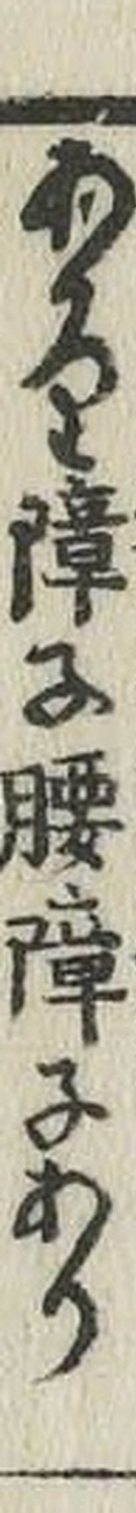あかり障子腰障子あり

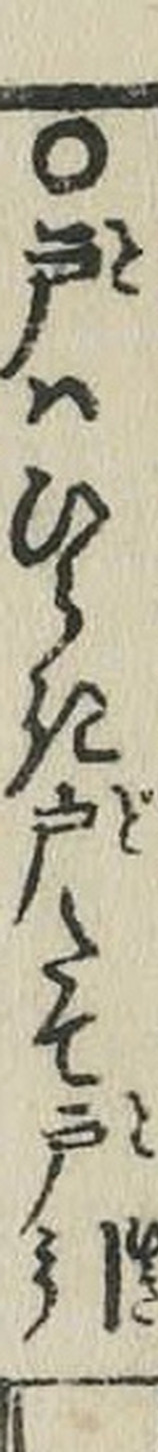○戸はひらき戸たて戸引
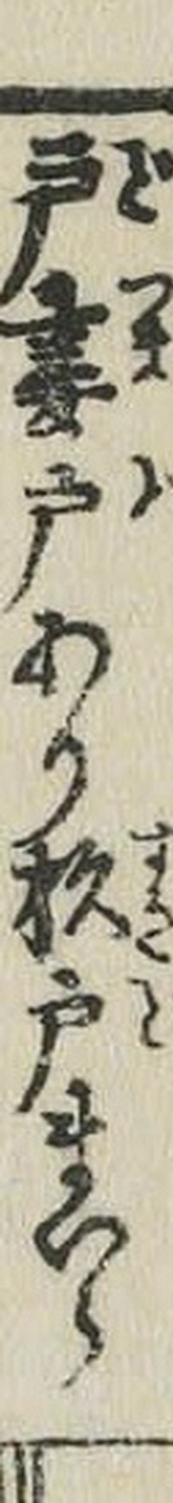戸妻戸あり杉戸まいら
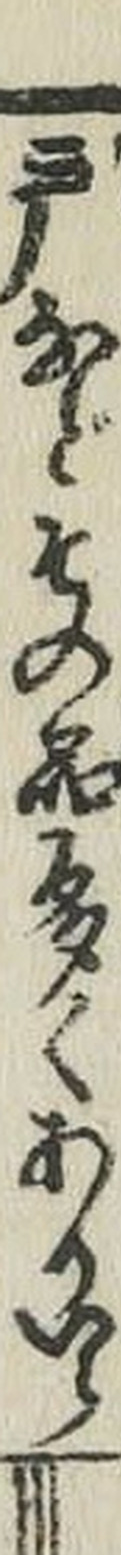戸などその品多くありいら
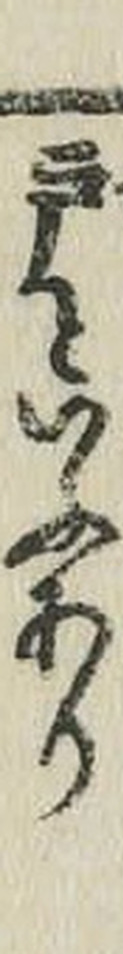戸といふあり
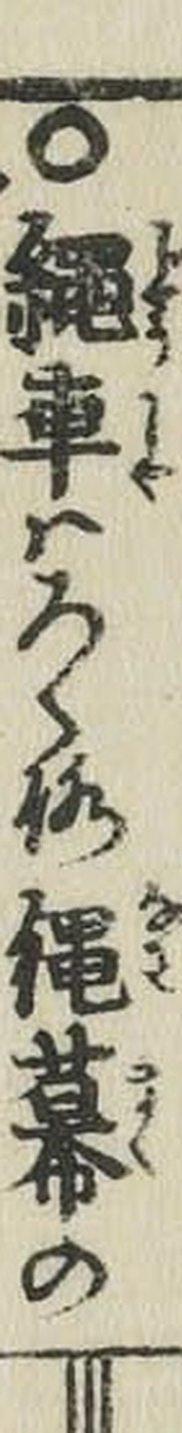○縄車はろくろ縄幕の
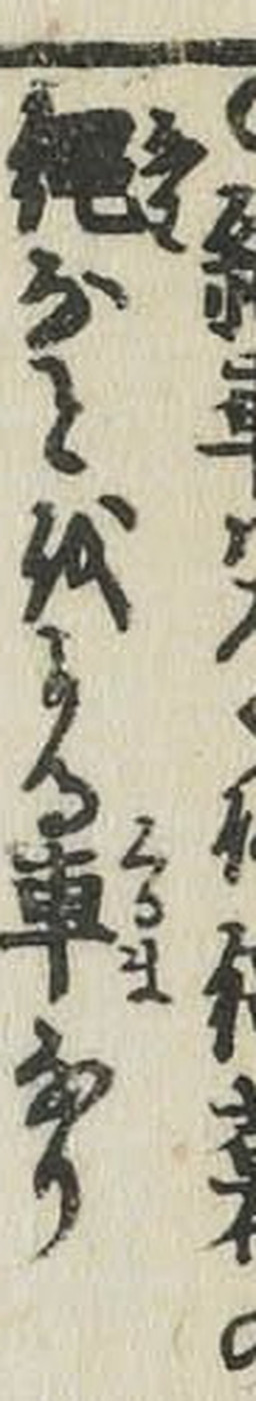縄なとをよる車なり
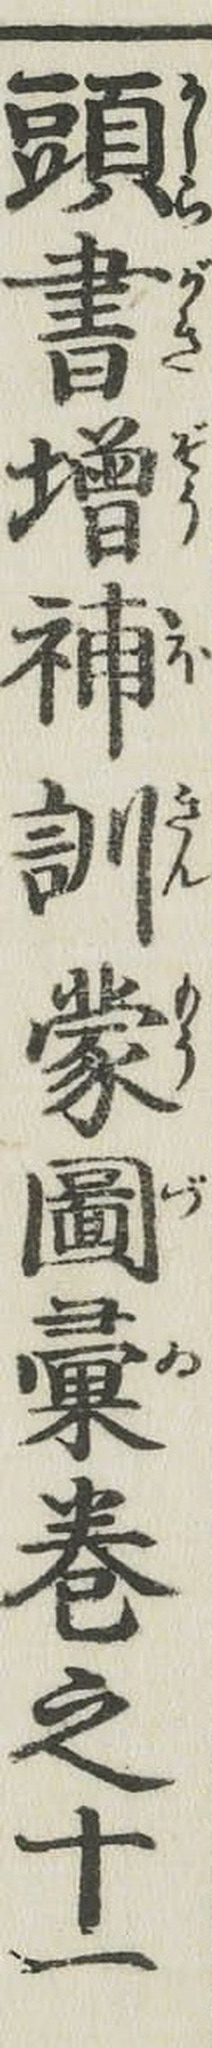頭書増補訓蒙図彙巻之十一
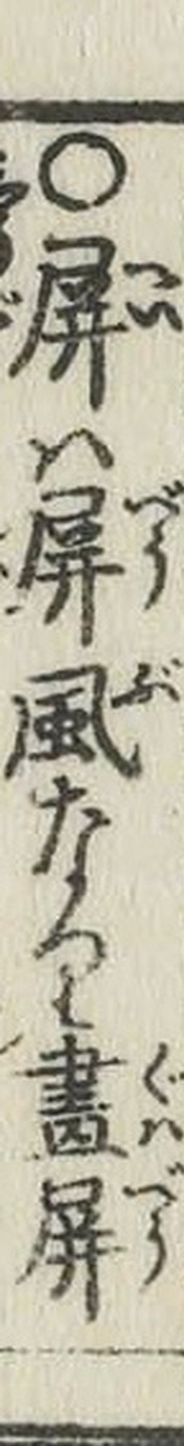○屏は屏風なり畫屏
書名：増補頭書訓蒙図彙大成 10巻 5:巻之9-11
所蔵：東京学芸大学教育コンテンツアーカイブ
